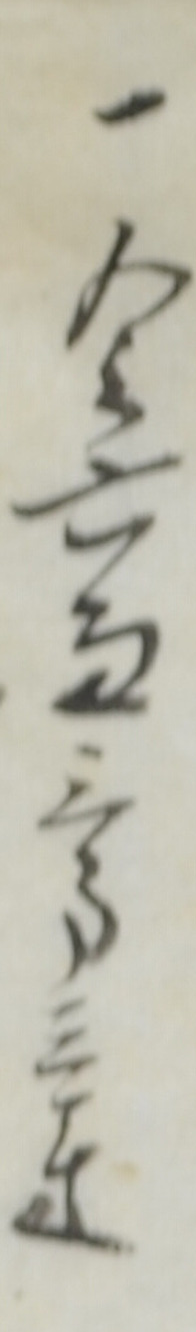一金六両三分三朱元金
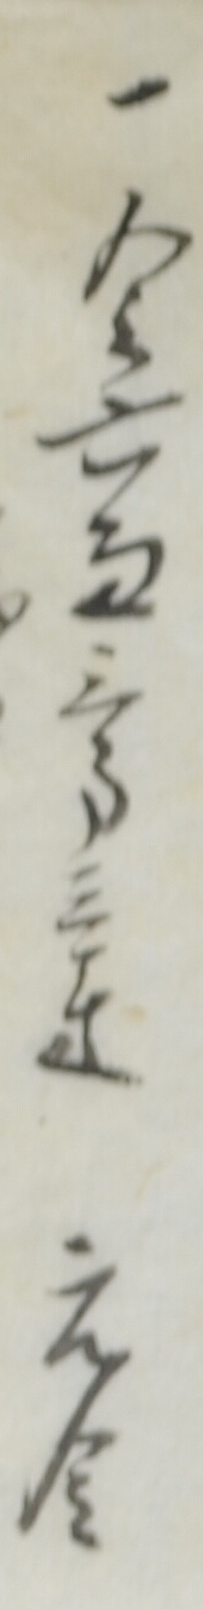一金六両三分三朱元金
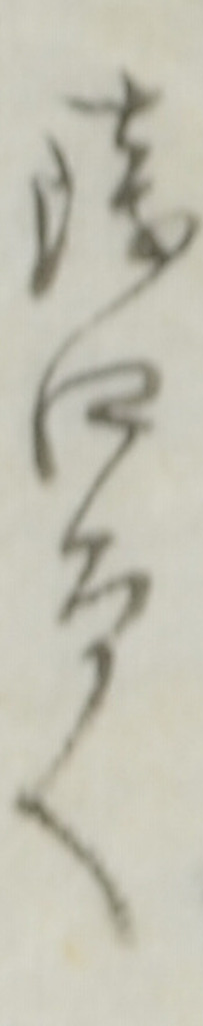銭四百文
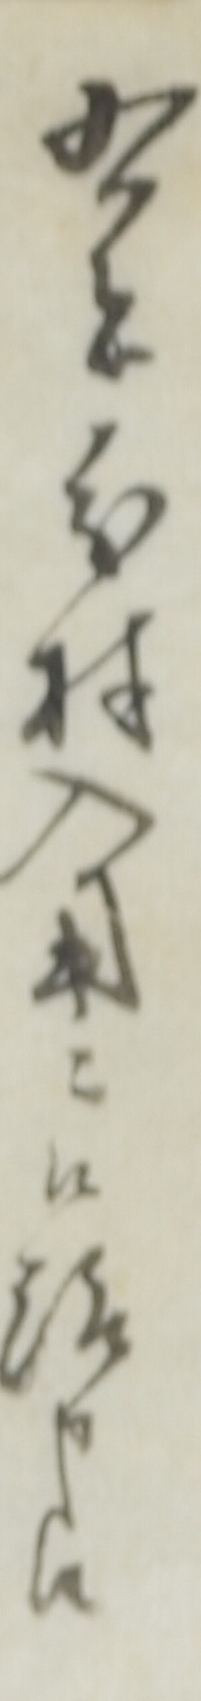右者分村入用二候様申候
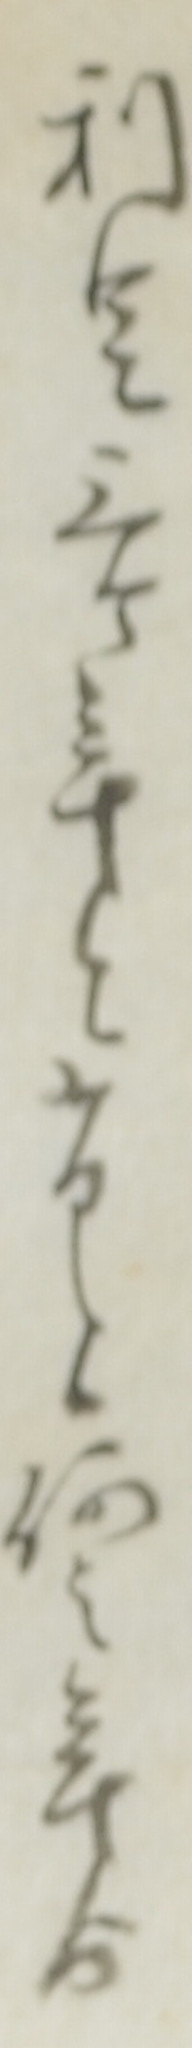利金三ケ年と有之候何之年ゟ
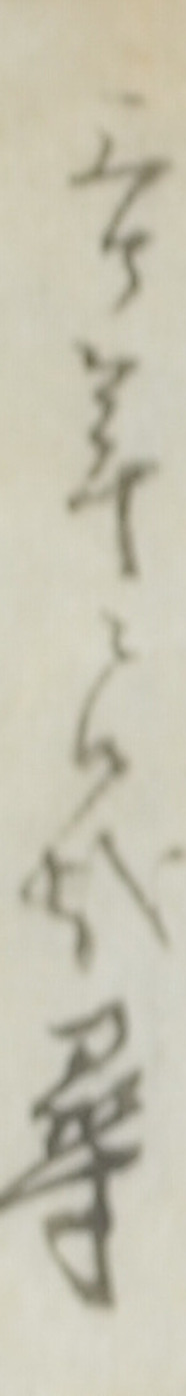三ケ年ニ候哉尋
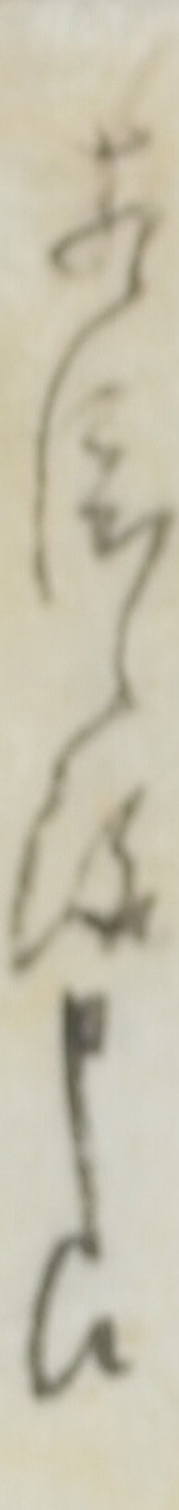相渡候様申候
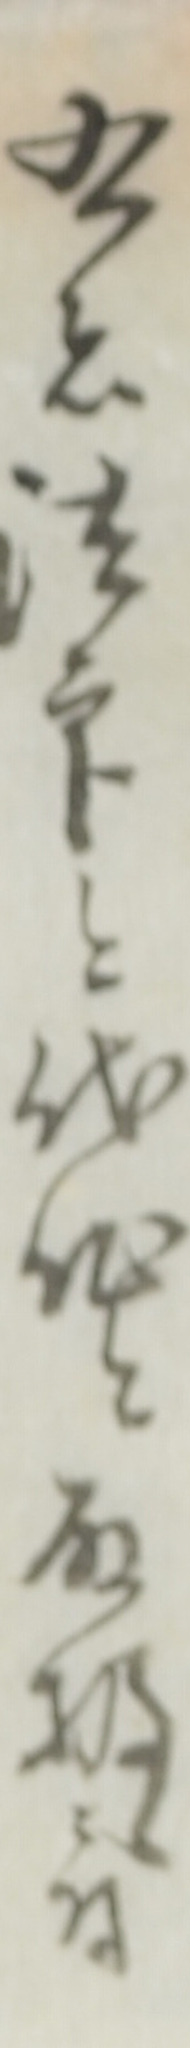右者法印と代作と取扱候ニ付
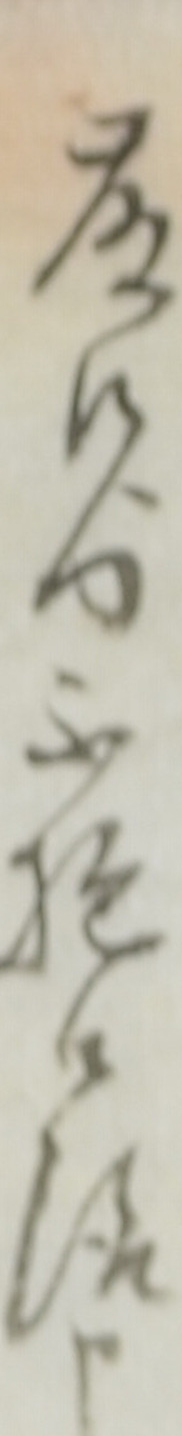藤左衛門不抱候様申候
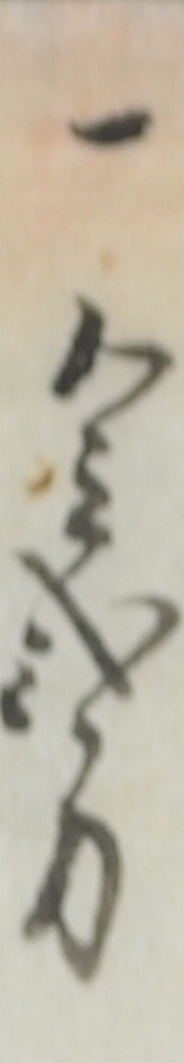一金弐分
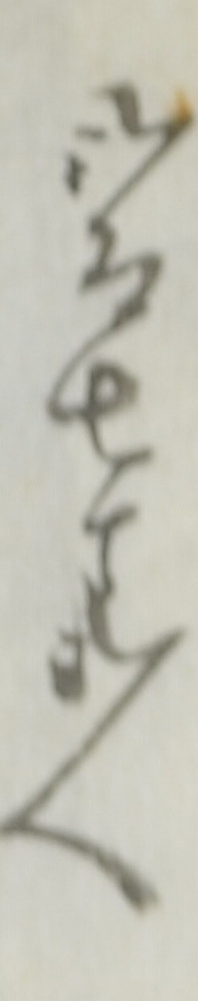弐百七十弐文
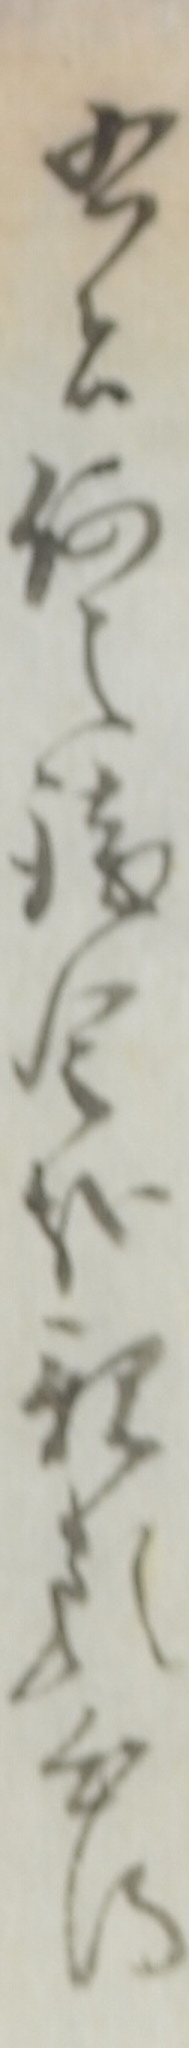右者何之銭金哉親類心得
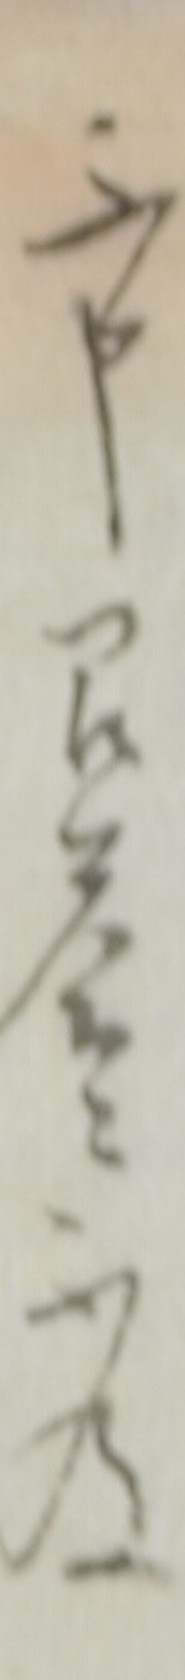不申即答ニ不及
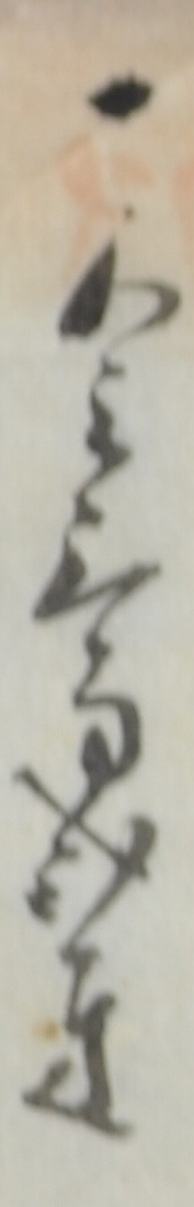一金三両弐朱
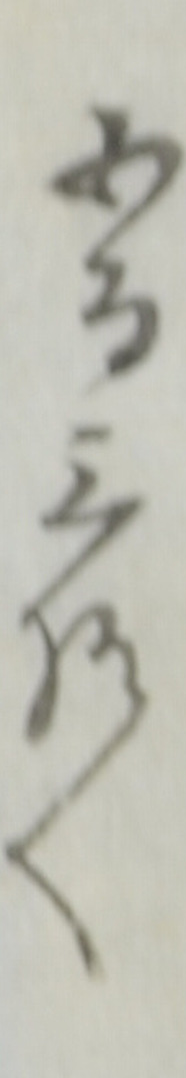五百三拾文

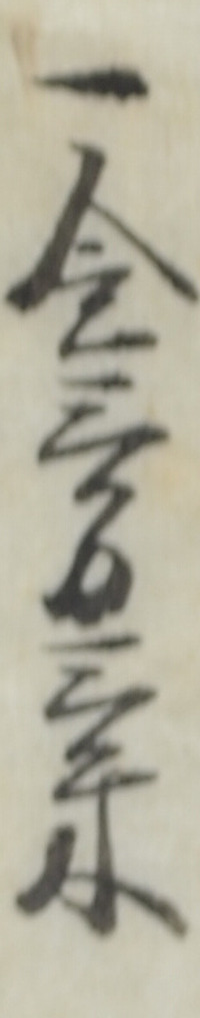一金三分三朱取分
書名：（金銭勘定抜書）
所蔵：伊那市立高遠町図書館・合同会社AMANE
